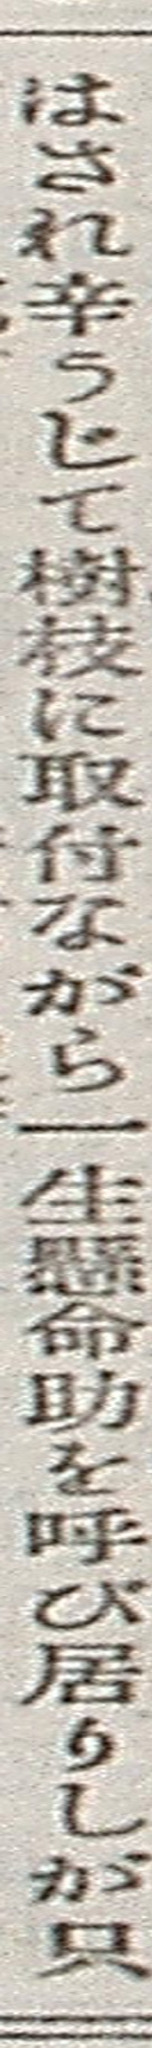はされ辛うじて樹枝に取付ながら一生懸命助を呼び居りしが只
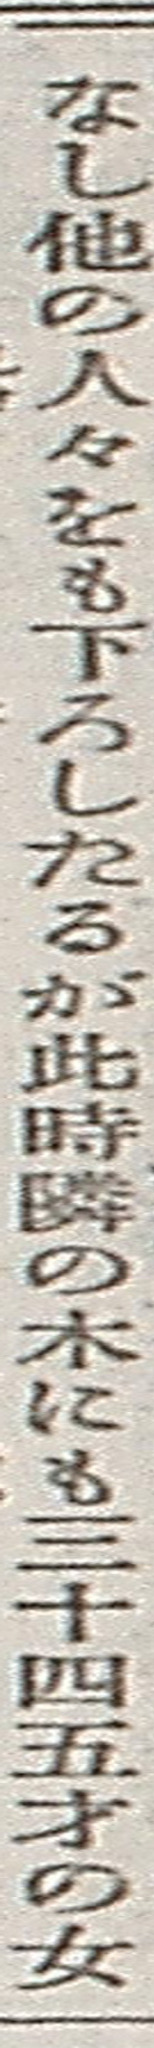なし他の人々をも下ろしたるが此時隣の木にも三十四五才の女
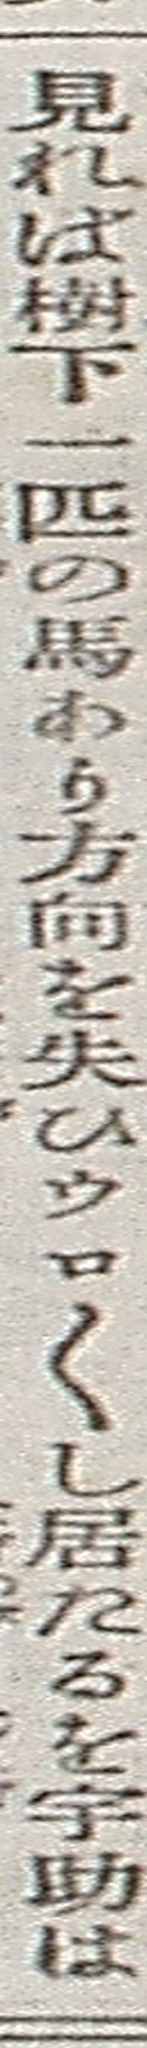見れば樹下一匹の馬あり方向を失ひウロ〳〵し居たるを宇助は
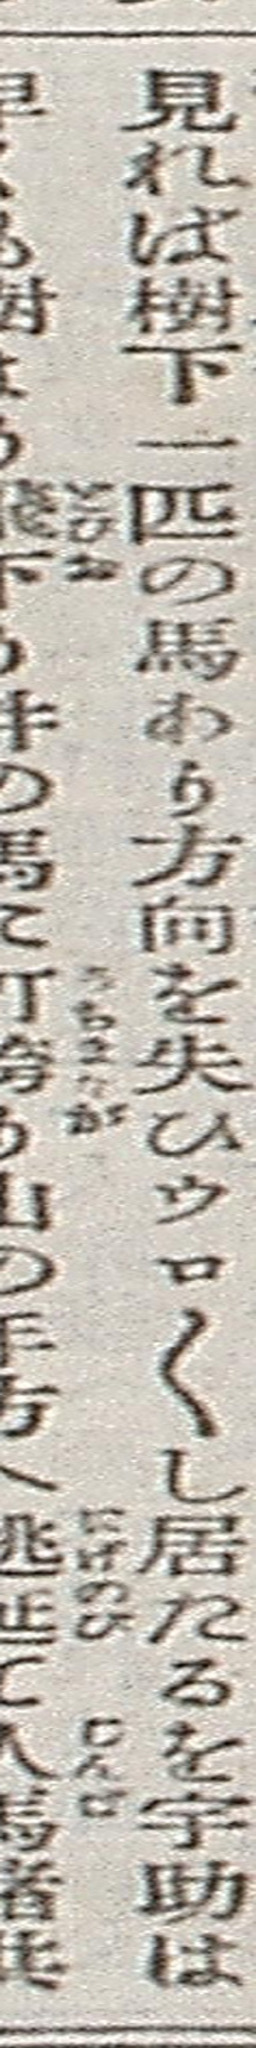早くも樹より飛下り件の馬に打跨り山の手方へ逃延て人馬諸共
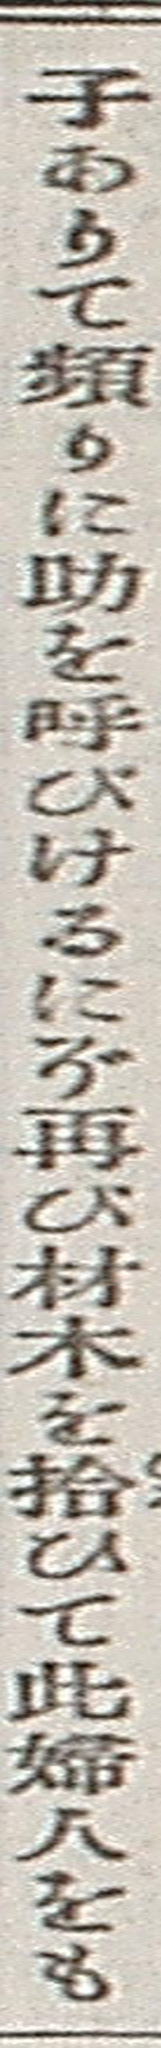子ありて頻りに助を呼びけるにぞ再び材木を拾ひて此婦人をも
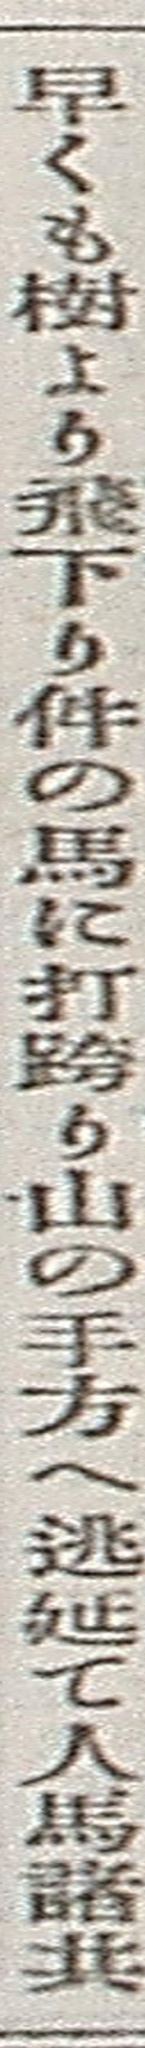早くも樹より飛下り件の馬に打跨り山の手方へ逃延て人馬諸共

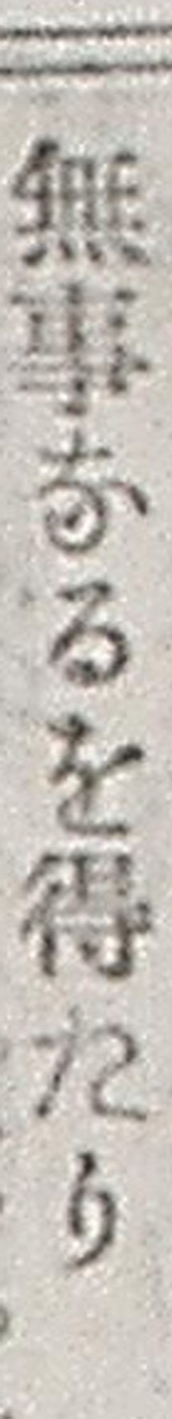無事なるを得たり
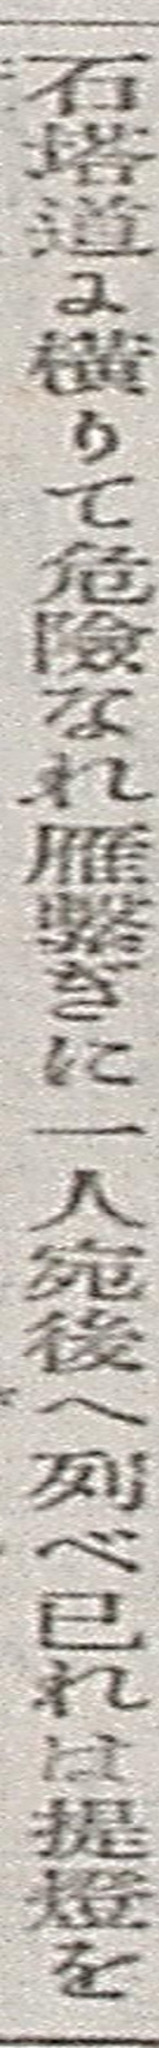石塔道に横りて危険なれ雁繋ぎに一人宛後へ列べ己れは提灯を
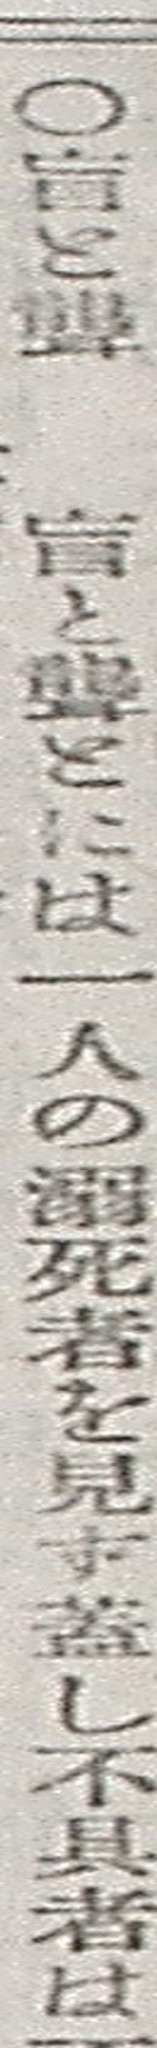○盲と聾盲と聾には一人の溺死者を見ず蓋し不具者は不
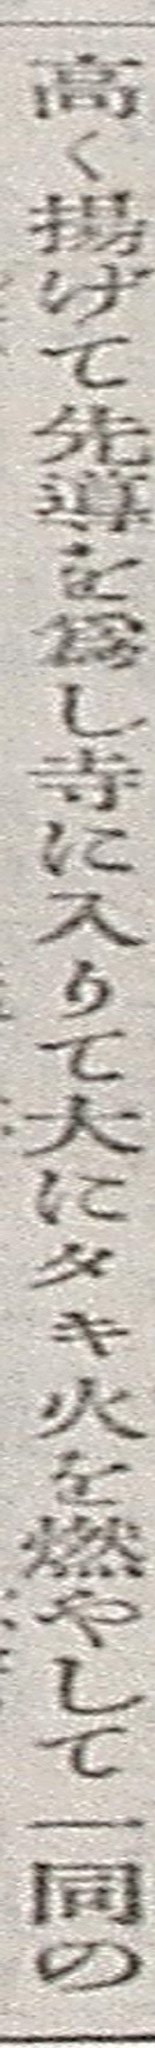高く揚げて先導を為し寺に入りて大にタキ火を燃やして一同の
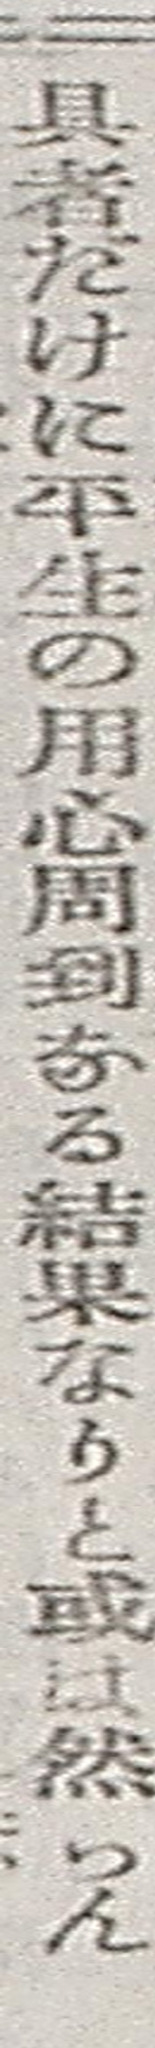具者だけに平生の用心周到なる結果なりと或は然らん
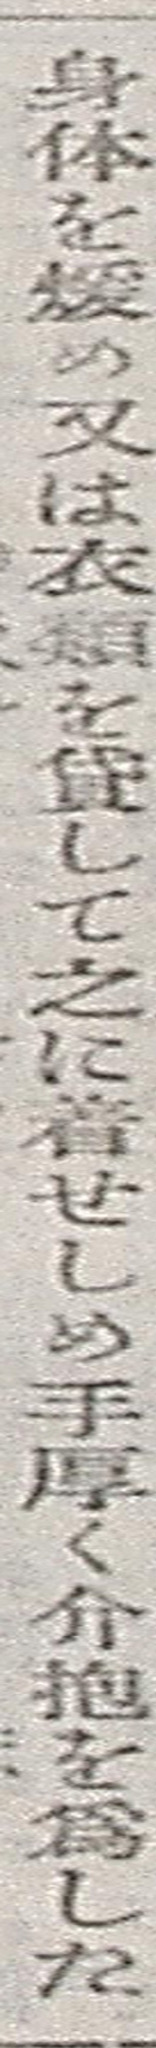身体を煖め又は衣類を貸して之に着せしめ手厚く介抱を為した
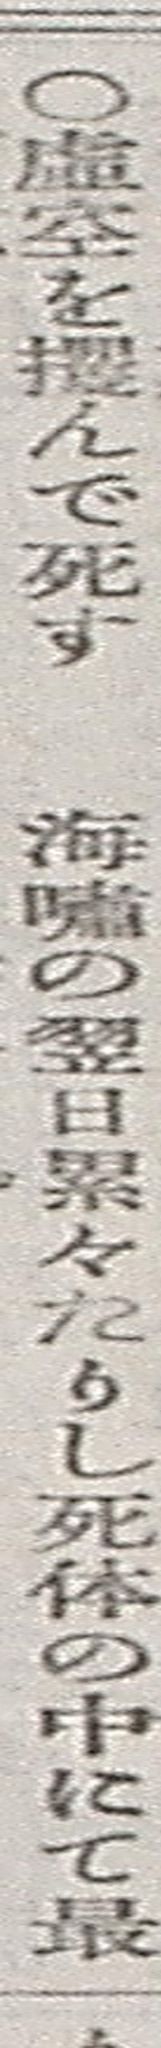○虚空を攫んで死す海嘯の翌日累々たりし死体の中にて最
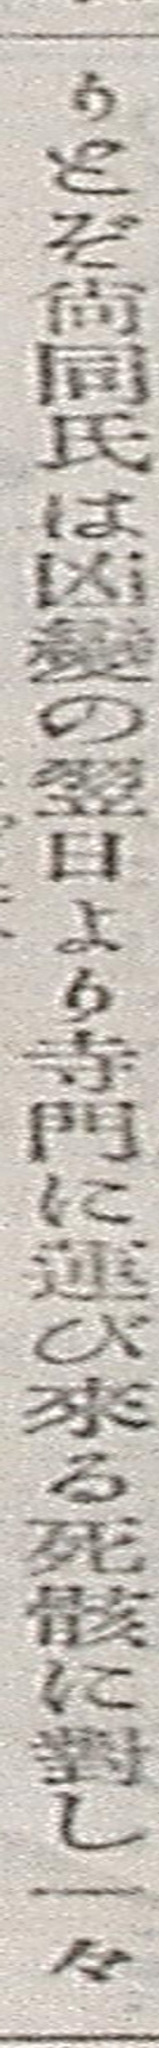りとぞ尚同氏は凶変の翌日より寺門に運び来る屍骸に対し一々
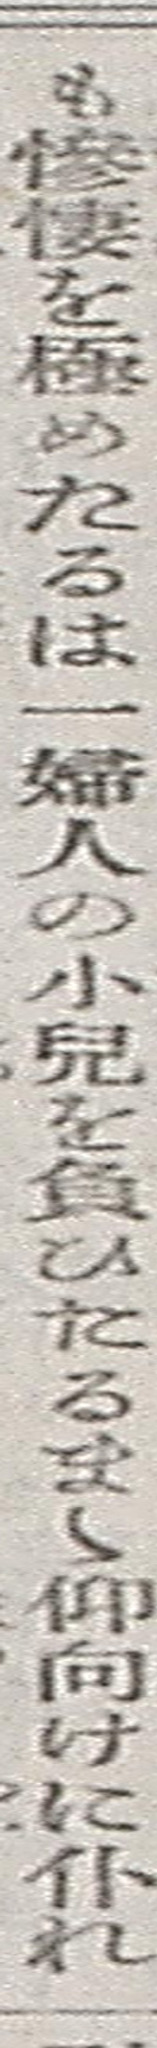も惨凄を極めたるは一婦人の小兒を負ひたるまゝ仰向けに仆れ
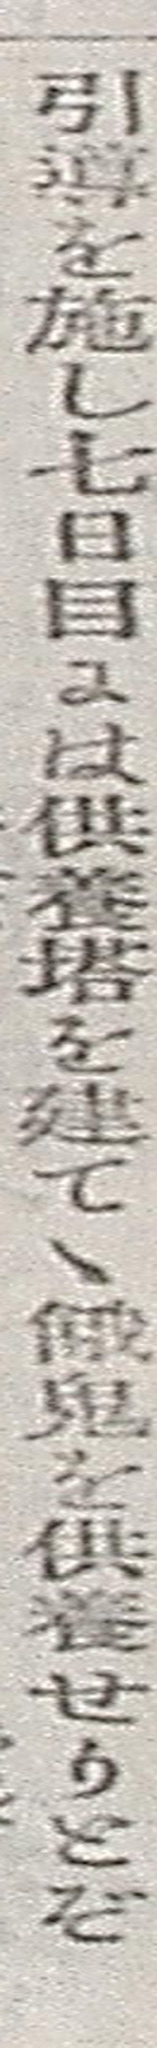引導を施し七日目には供養塔を建てゝ餓鬼を供養せりとぞ
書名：風俗畫報臨時増刊第百二十號　大海嘯被害録（下）
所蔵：東京大学地震研究所図書室 Earthquake Research Institute Library, The University of Tokyo, JAPAN
